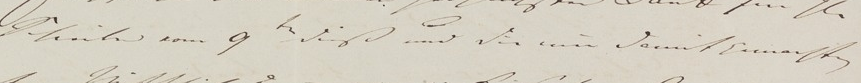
Schreiben vom 9ten dieß und die mir damit gemachten
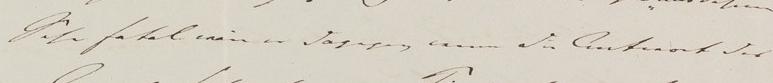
Sehr fatal wäre es dagegen, wenn die Antwort des
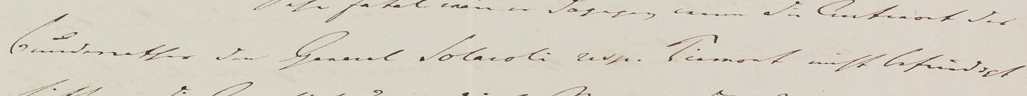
Bundesrathes den General Solaroli resp. Piemont nicht befriedigt
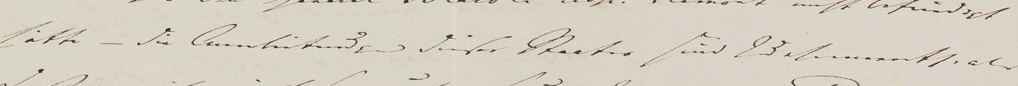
hätte – die Anerbietungen dieses Staates sind zu ehrenwerth, als
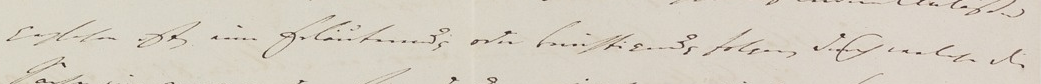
geschehen ist, eine Erläuterung oder Berichtigung folgen, durch welche die
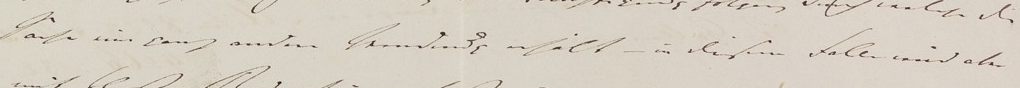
Sache eine ganz andere Wendung erhält – in diesem Falle wird aber
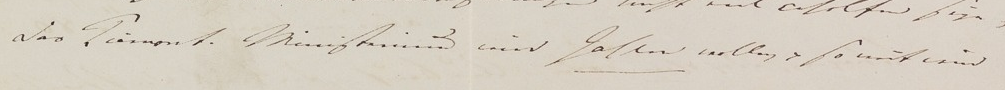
das Piemont. Ministerium wird Zahlen wollen & somit wird
